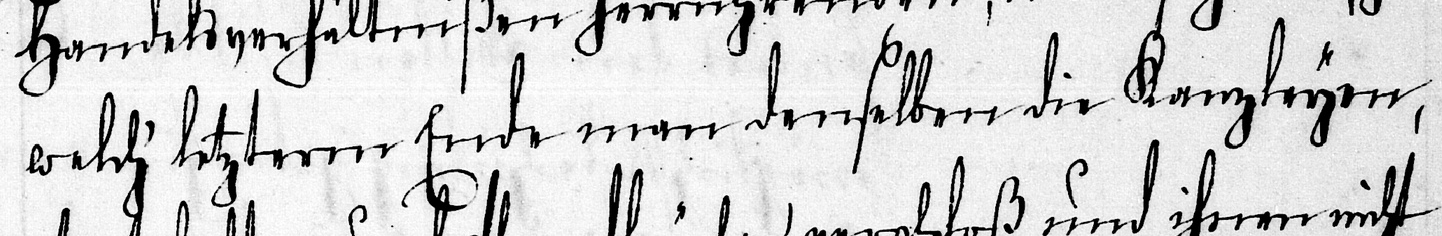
welch’ letzterm Ende man denselben die Kanzleyen,
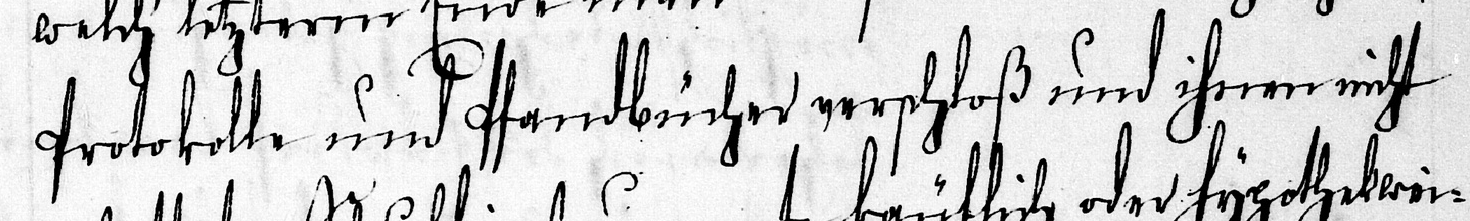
Protokolle und Pfandbücher verschloß und ihnen nicht
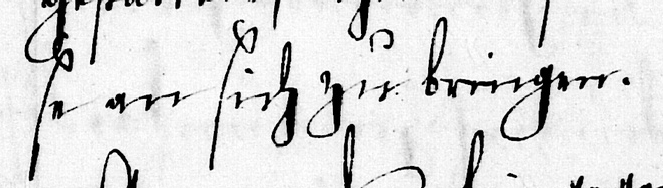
se an sich zu bringen.
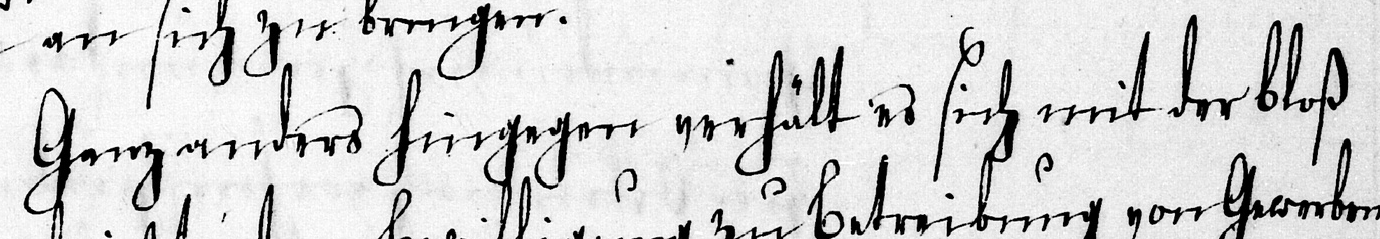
Ganz anders hingegen verhält es sich mit der bloß
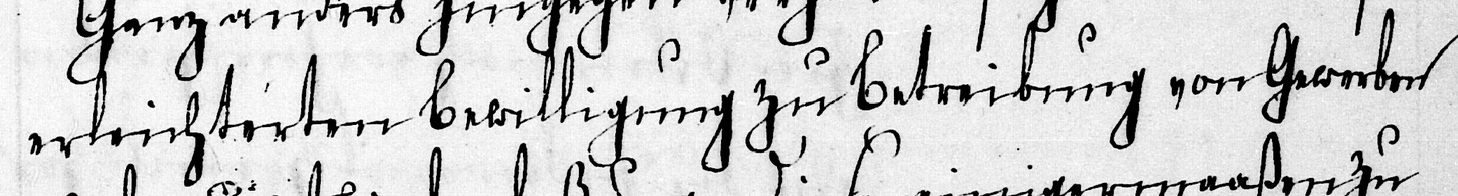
erleichterten Bewilligung zu Betreibung von Gewerben
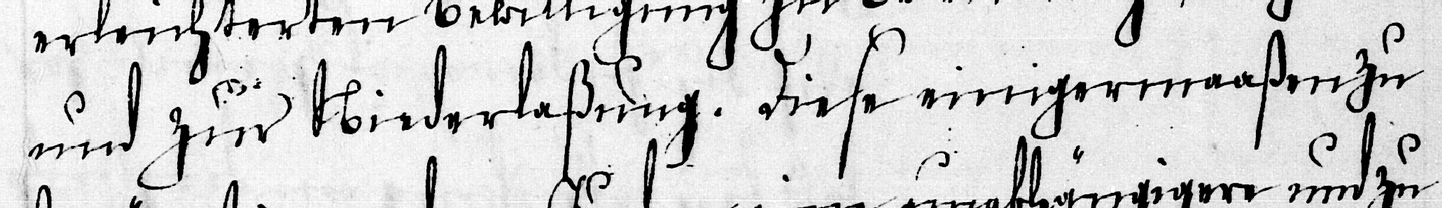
und zur Niederlaßung. Diese einigermaaßen zu
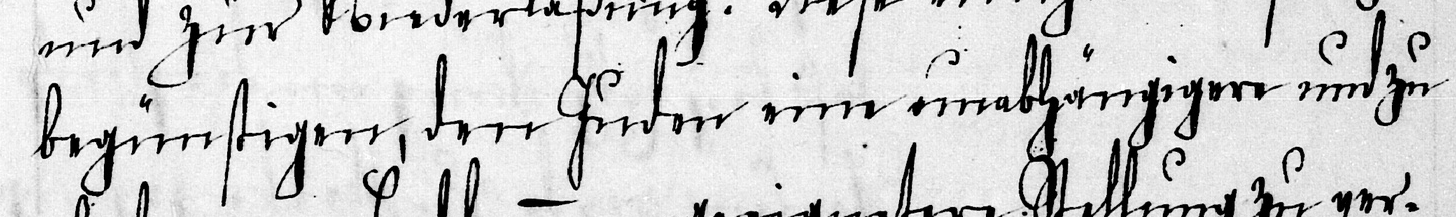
begünstigen, den Juden eine unabhängigere und zu
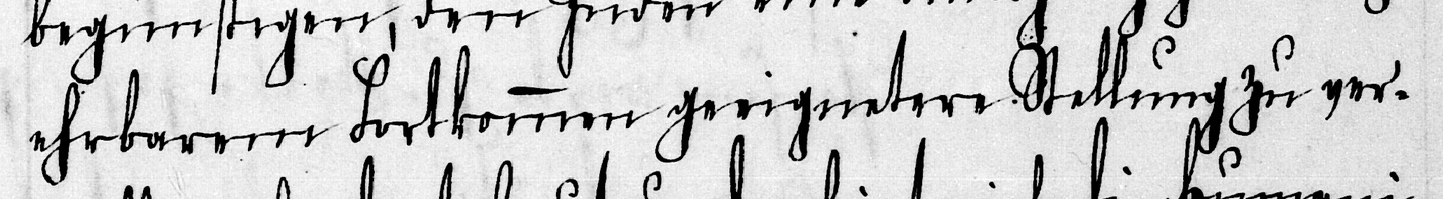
ehrbarem Fortkommen geeignetere Stellung zu ver¬
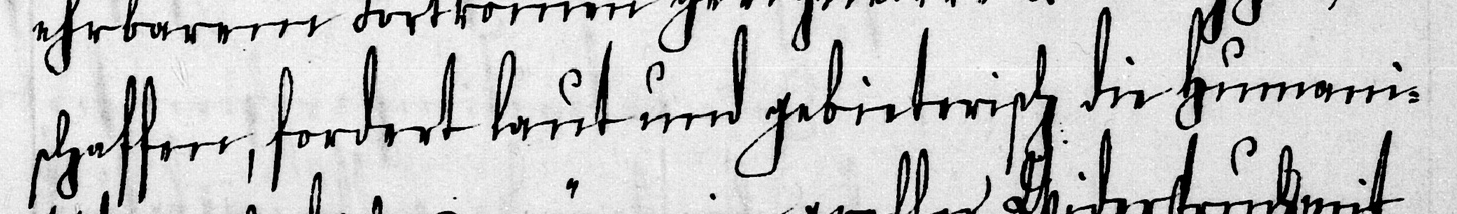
schaffen, fordert laut und gebieterisch die Humani¬
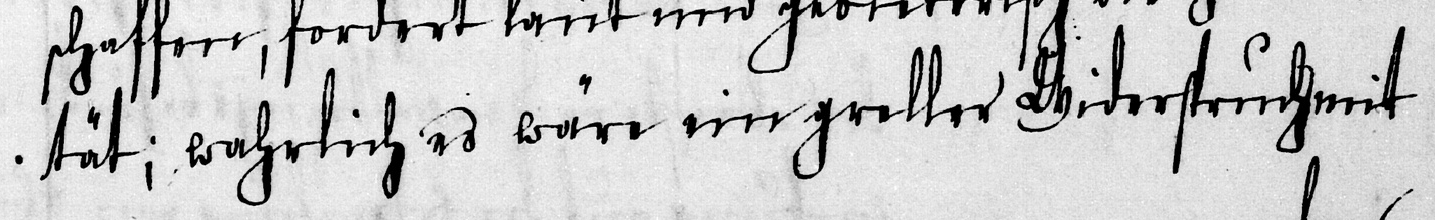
tät; wahrlich es wäre ein greller Widerspruch mit
